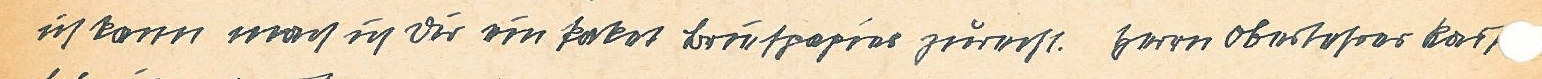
ich kann mach ich Dir ein Paket Briefpapier zurecht. Herrn Oberlehrer K.
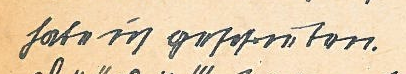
habe ich geschrieben.
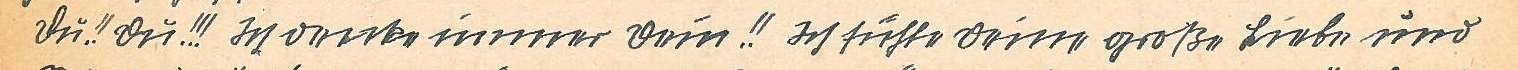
Du!! Du!!! Ich denke immer Dein!! Ich fühle Deine große Liebe und
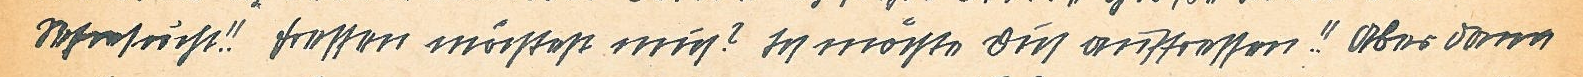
Sehnsucht!! Fressen möchtest mich? Ich möchte Dich auffressen!! Aber dann
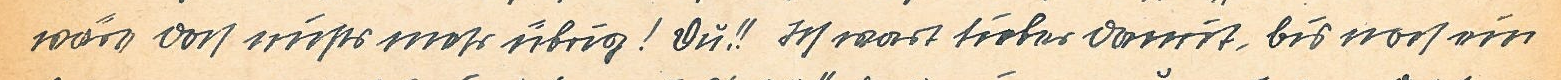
wäre doch nichts mehr übrig! Du!! Ich wart lieber damit, bis noch ein
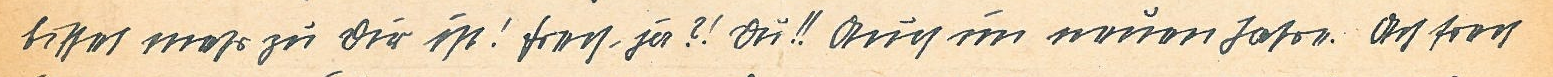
bissel mehr zu Dir ist! Frech, ja?! Du!! Auch im neuen Jahre. Ach frech
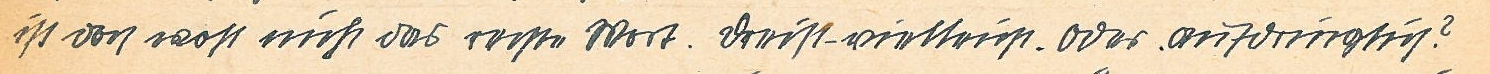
ist doch wohl nicht das rechte Wort. Dreist – vielleicht. oder. aufdringlich?
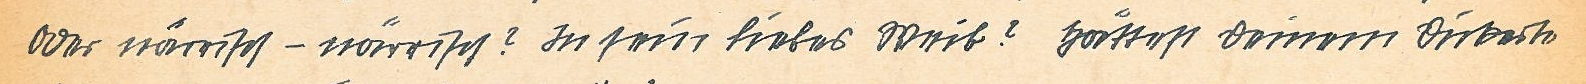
Oder närrisch — närrisch? In sein liebes Weib? Hättest Deinem Dickerle
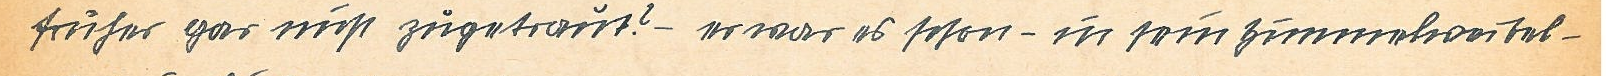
früher gar nicht zugetraut? — er war es schon — in sein Himmelsweibel —
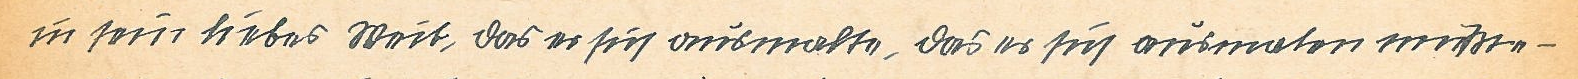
in sein liebes Weib, das er sich ausmalte, das er sich ausmalen mußte —
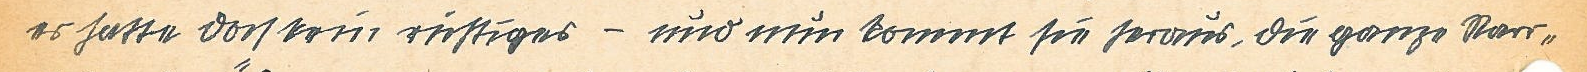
er hatte doch kein richtiges — und nun kommt sie heraus, die ganze Narr¬
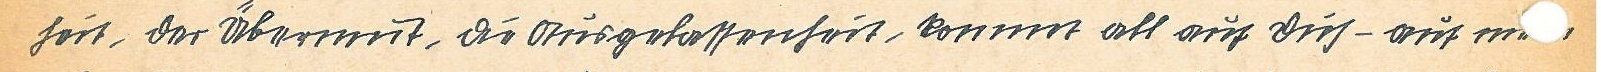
heit, der Übermut, die Ausgelassenheit, kommt all auf Dich — auf mein
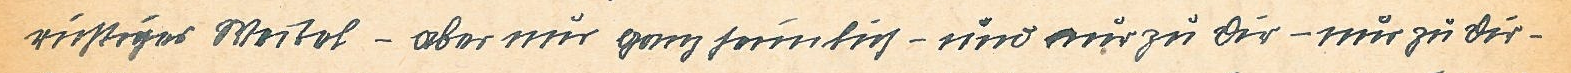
richtiges Weibel — aber nur ganz heimlich — und nur zu Dir —
